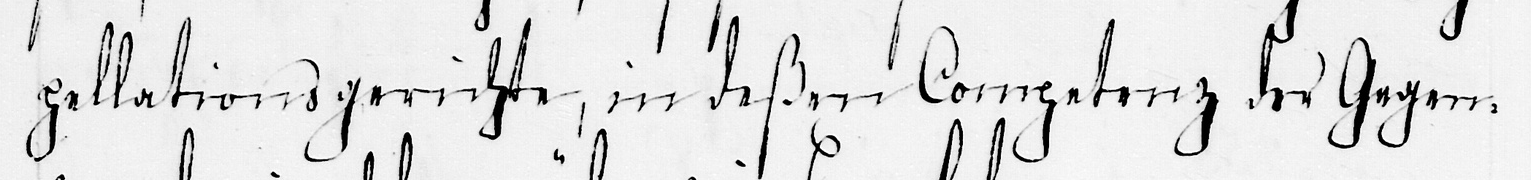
pellationsgerichte, in deßen Competenz der Gegen¬
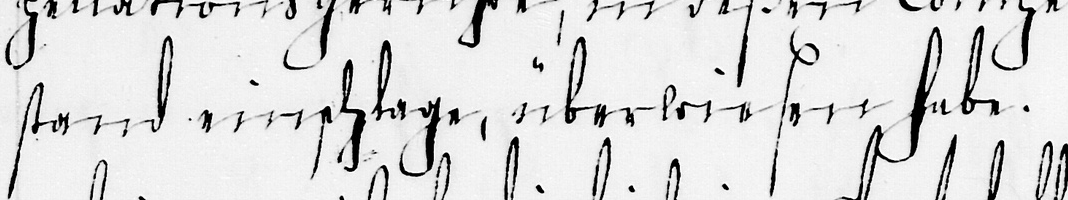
stand einschlage, überwiesen habe.
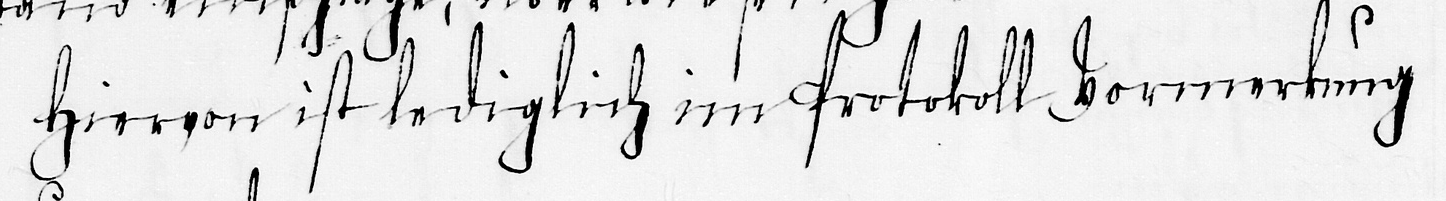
Hiervon ist lediglich im Protokoll Vormerkung
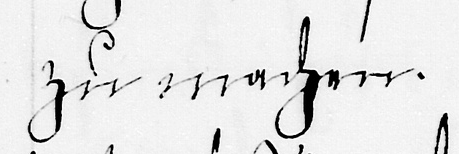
zu machen.
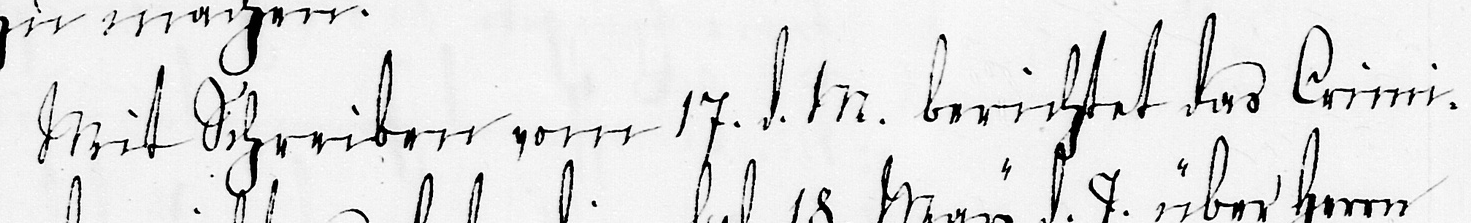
Mit Schreiben vom 17. d. M. berichtet das Crimi¬
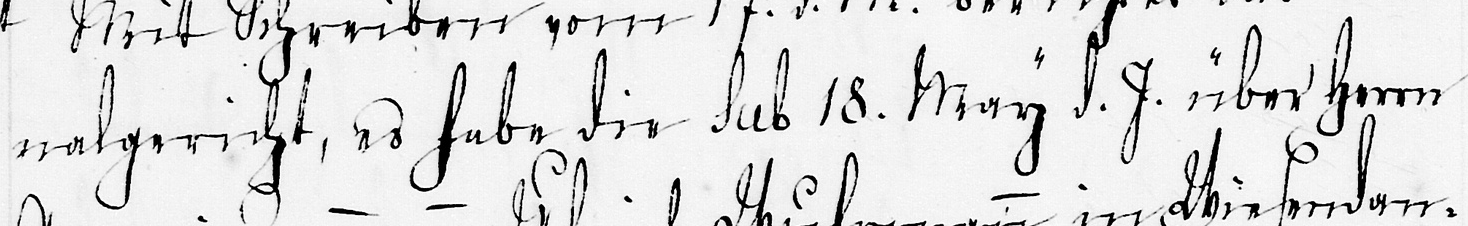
nalgericht, es habe die sub 18. May d. J. über Herrn
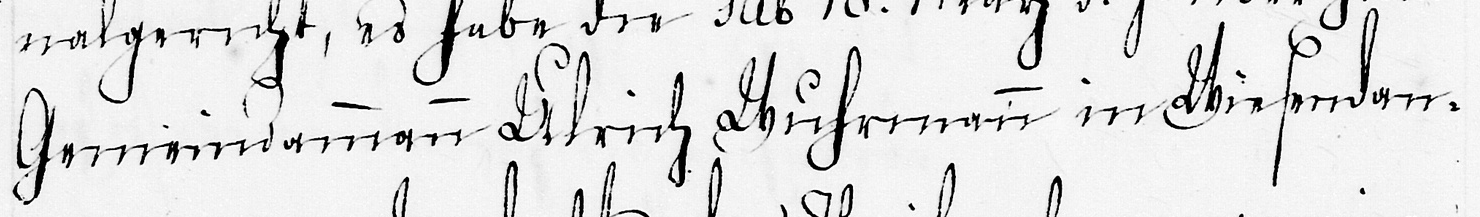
Gemeindammann Ulrich Wuhrmann in Wiesendan¬
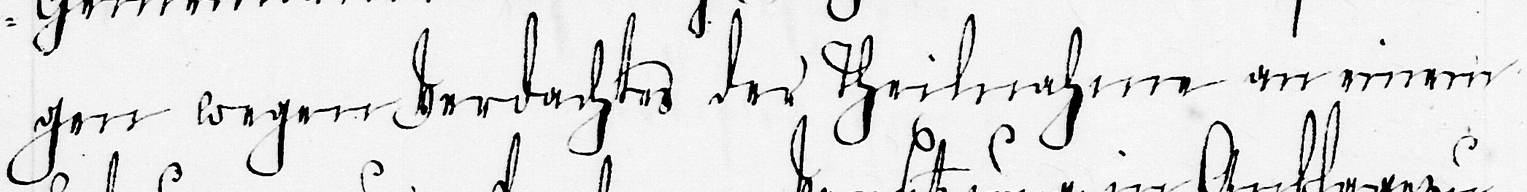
gen wegen Verdachtes der Theilnahme an einem
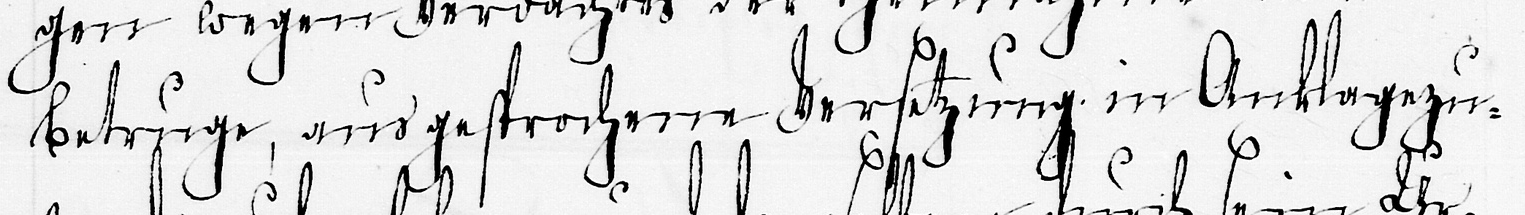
Betruge, ausgesprochene Versetzung in Anklagezu¬
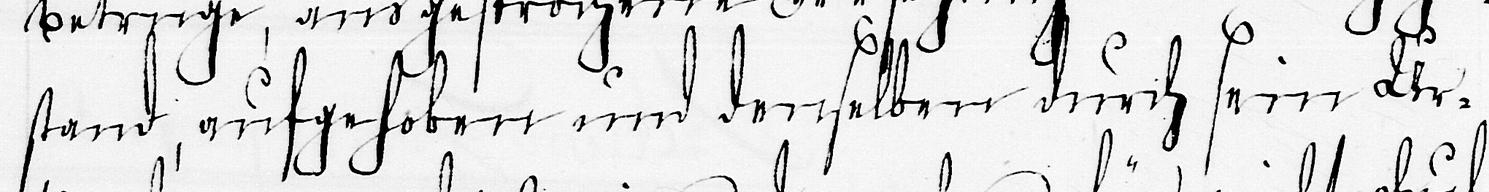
stand, aufgehoben und denselben durch sein Ur¬
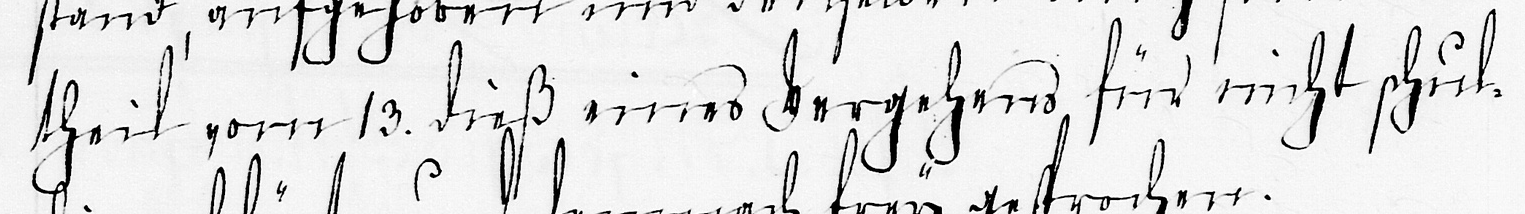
theil vom 13. dieß eines Vergehens für nicht schul¬
